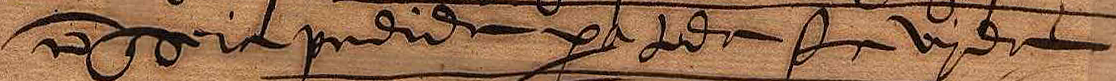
c̄o q̄ seia perdida ꝑa toda sua vyda
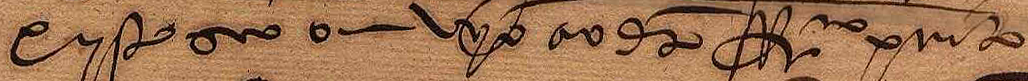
e ysto soo ouvyo ao dt̄o ffrco pinto
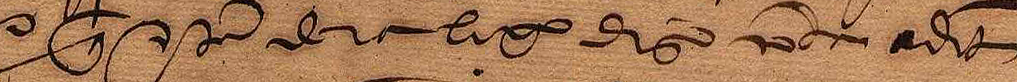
de q̄ ētā dera logo diso cōta a dita
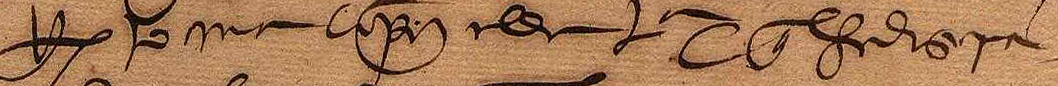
Rꝭ Joana lopez ella ta e q̄ lhe disera
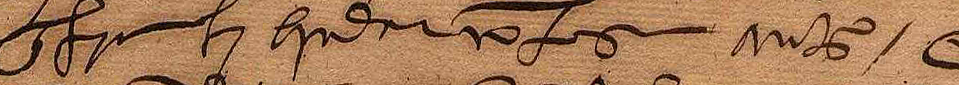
q̄ hya hy bradar c̄o ho seu anto / e
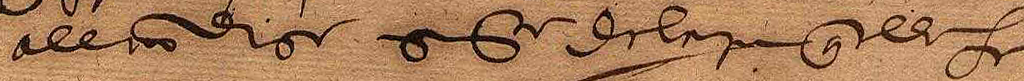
all nō dise somte declara q̄ ella he
